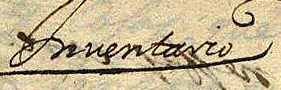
Inuentario
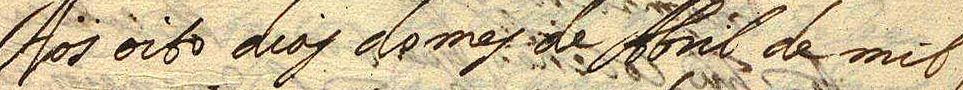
Aos oito dias do mes de Abril de mil,
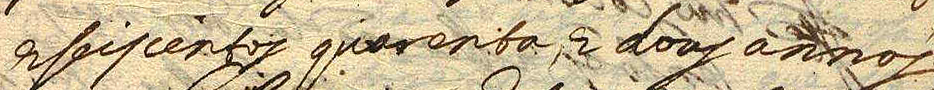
E seiscentos quarenta, E dous annos
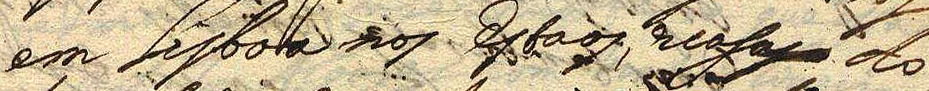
em Lisboa nos Estaos, E casas do
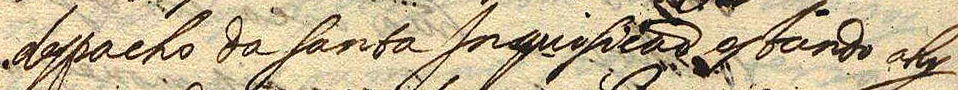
despacho da santa Jnquisiçaõ estando ahy
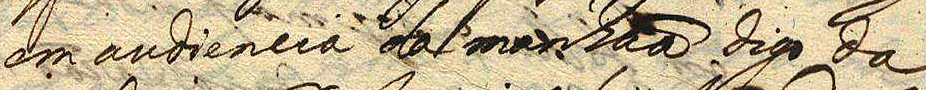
em audiencia da manhaã digo da
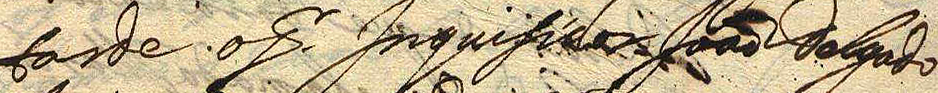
tarde o s.r Jnquisidor Joaõ Delgado
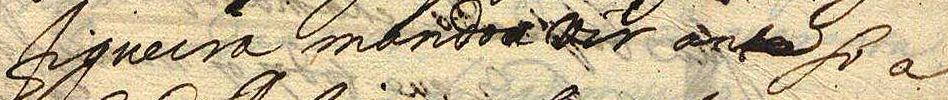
figueira mandou vir ante si a
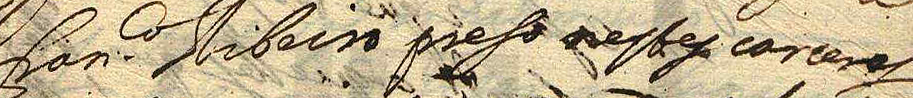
fran.co Ribeiro preso nestes carceres
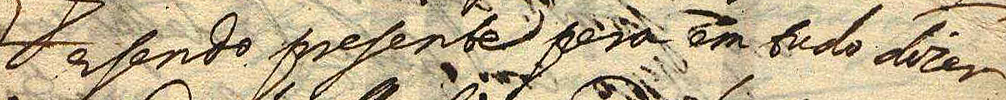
e sendo presente pera em tudo dizer
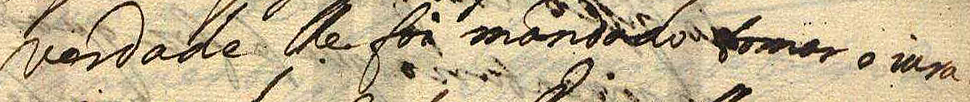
verdade lhe foi mandado tomar o iura
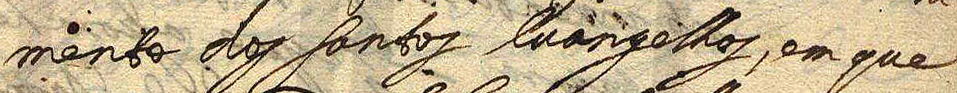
mento dos santos euangelhos, em que
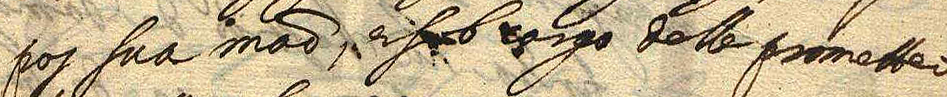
pos sua maõ, e sob cargo delle prometteo
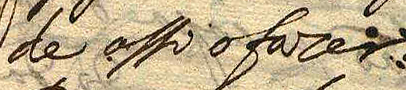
de assi o fazer.
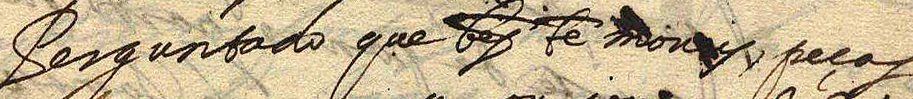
Perguntado que bēs tē moueis, peças
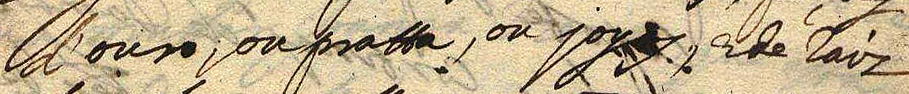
d'ouro, ou pratta, ou joy_s, E de Raiz
